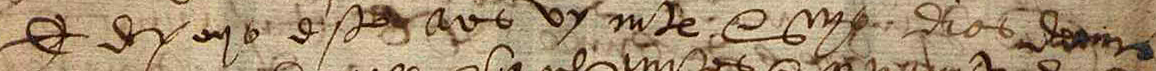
E depoys desto aos vymte e seys dias do mes
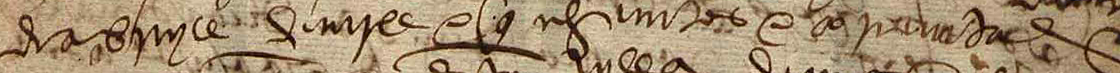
de abryll de mjll e q̄nhemtos e coremta he
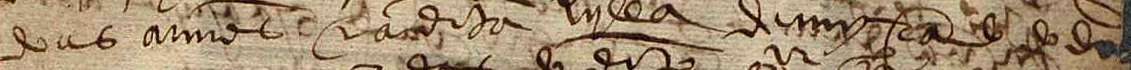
dous annos ē a dita vylla de myrādo do do
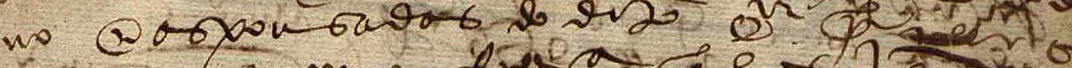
ruo ē as pousadas do dito Cor p̄o elle Cor
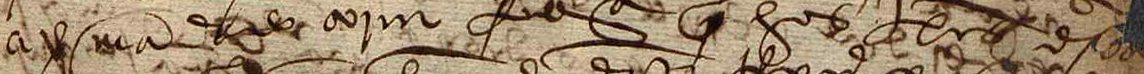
aꝟ mādado corer folha p̄o hos tb̄es desta
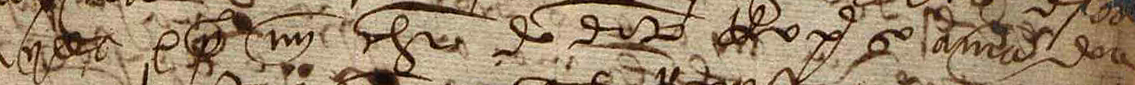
vylla e p̄o m̄j c̄hr do dito Reo p̄so a mādou
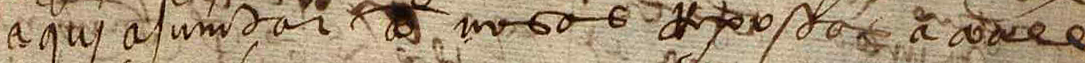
aquj aJumtar c̄o nosas Repostas a coall
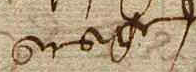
se sege
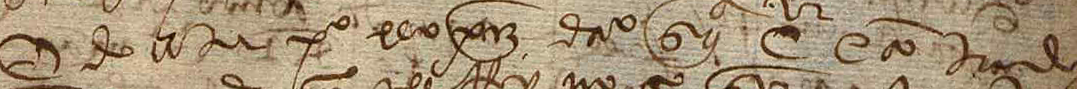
O doutor po llopez daoseq̄a Cor e c̄otador
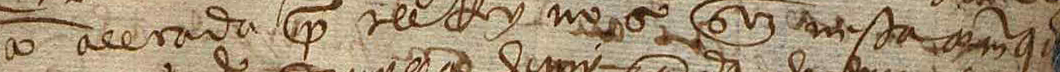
c̄o allçada p̄o ell Rey noso s̄or nesta com̄qu
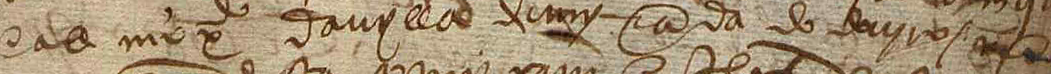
e allmoxdo da uylla de myrāda do douro / mā
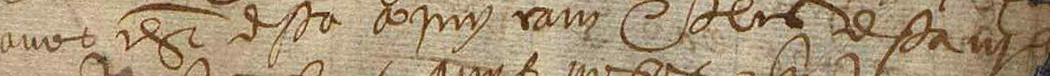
a uos c̄hr desta comycam e tbēs desta ujll
